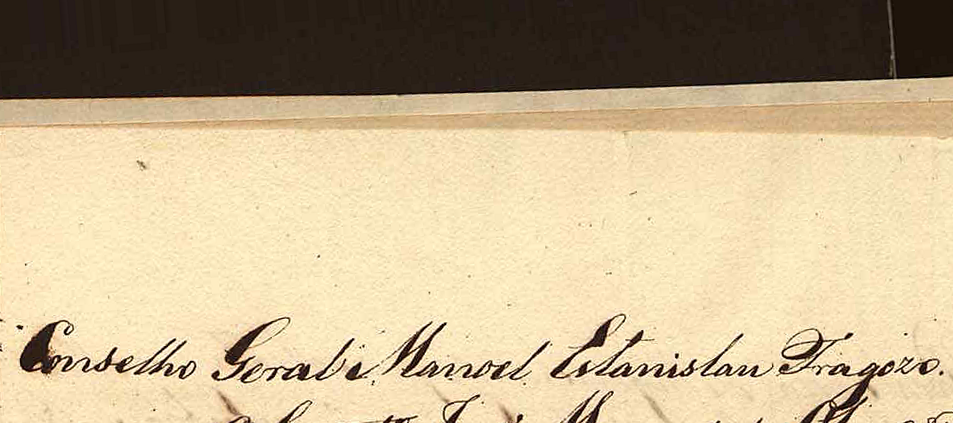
Conselho Geral Manoel Estanislau Fragozo.
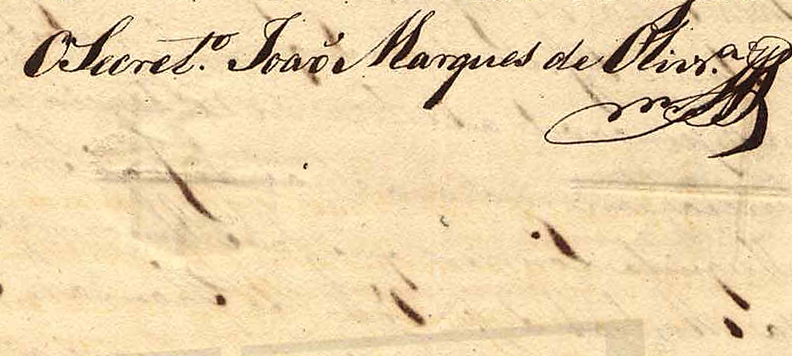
O Secret.o Ioaõ Marques de Olivr.a
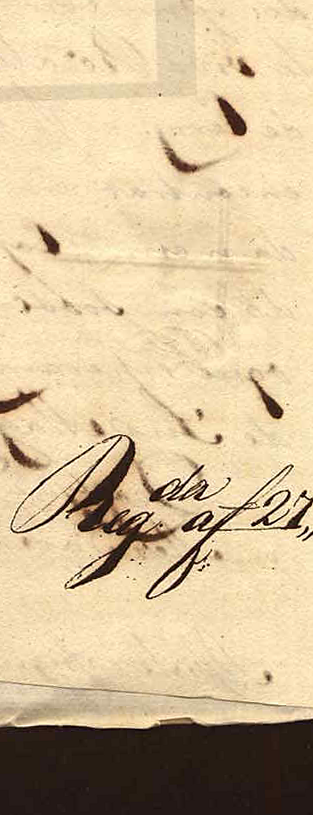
Reg.da a f.27
